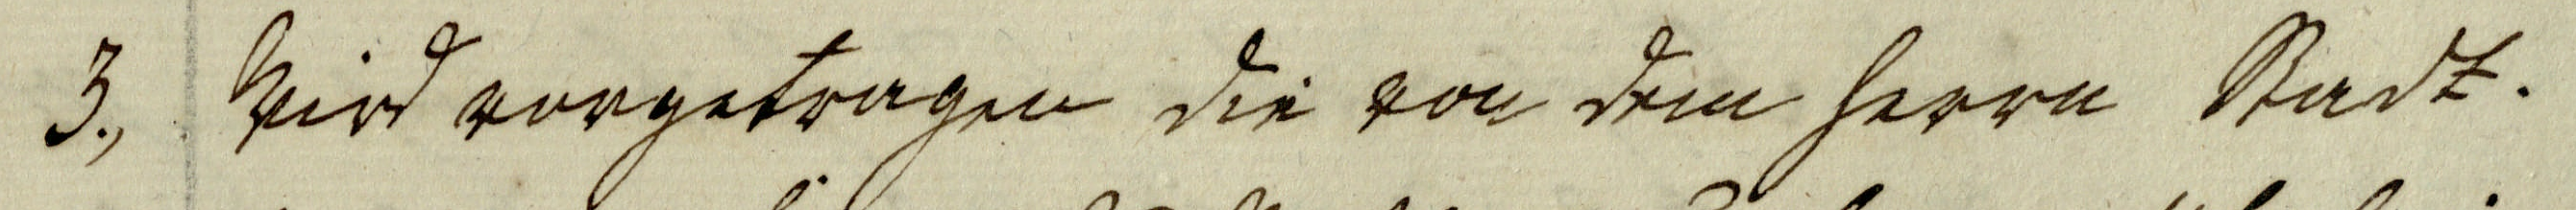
3., Wird vorgetragen die vom dem Herrn Stadt¬
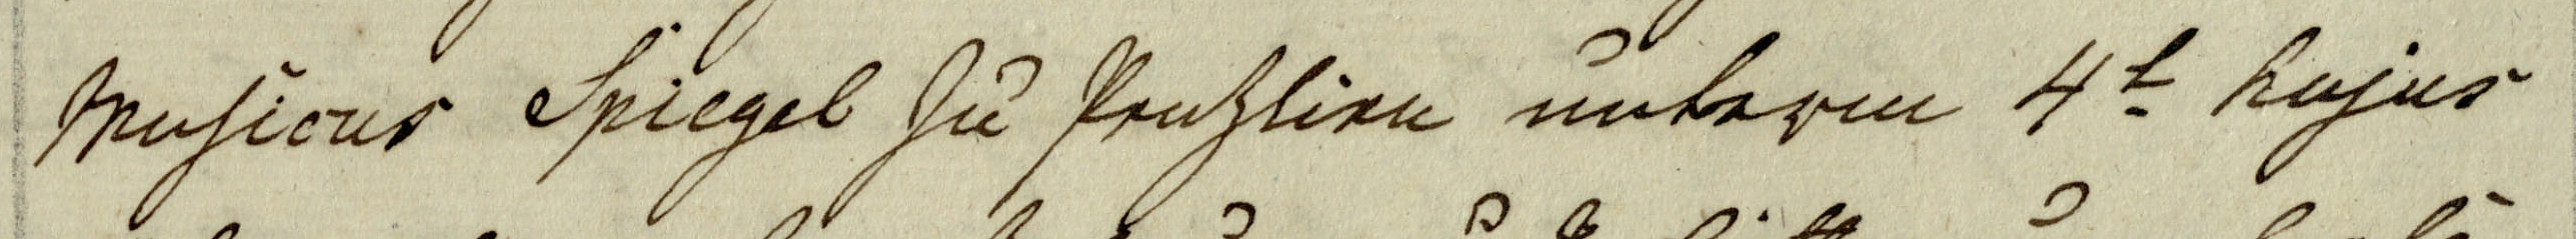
Musicus Spiegel zu Penzlien unterm 4t. hujus
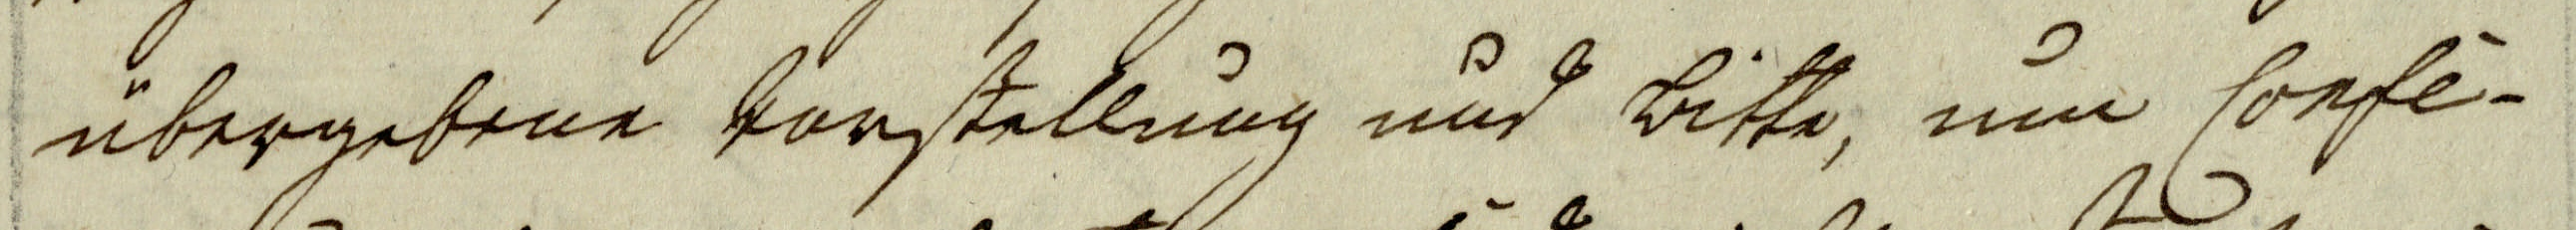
übergebene Vorstellung und Bitte, um Confe¬
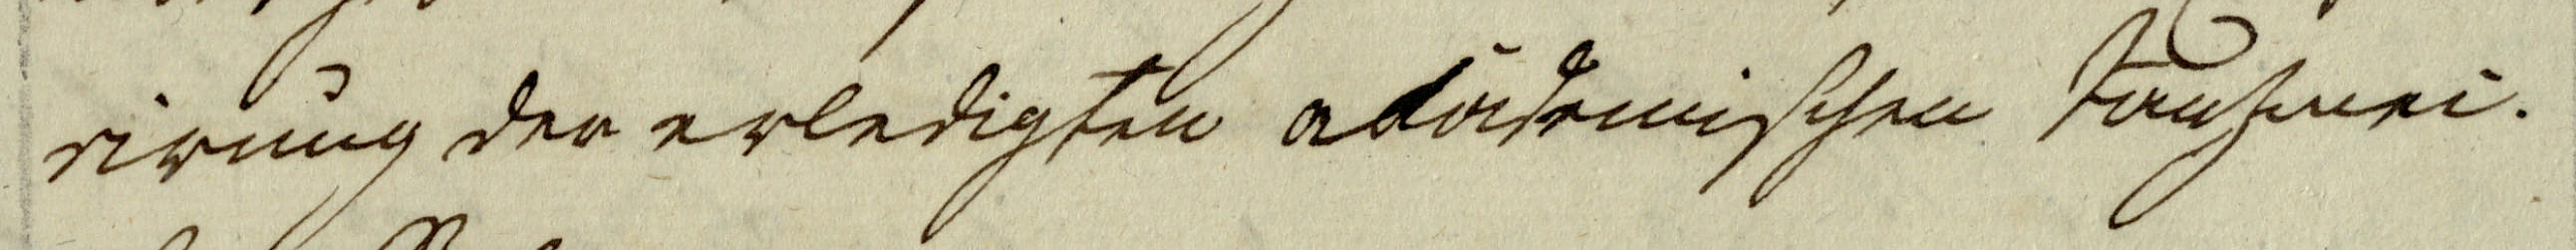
rirung der erledigten akademischen Tanzmei¬
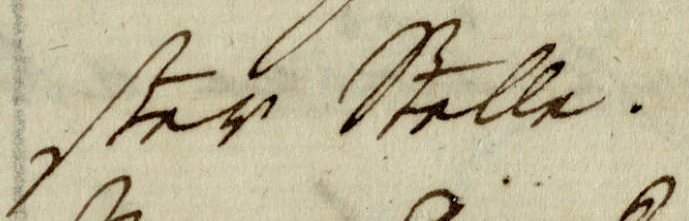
ster Stelle.
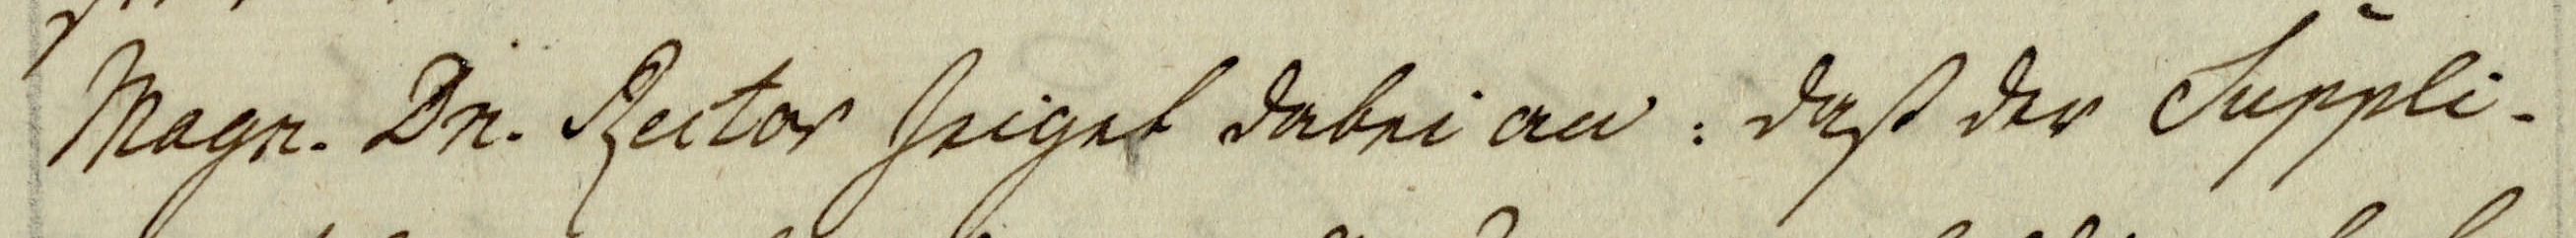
Magn. Dn. Rector zeiget dabei an: daß der Suppli¬
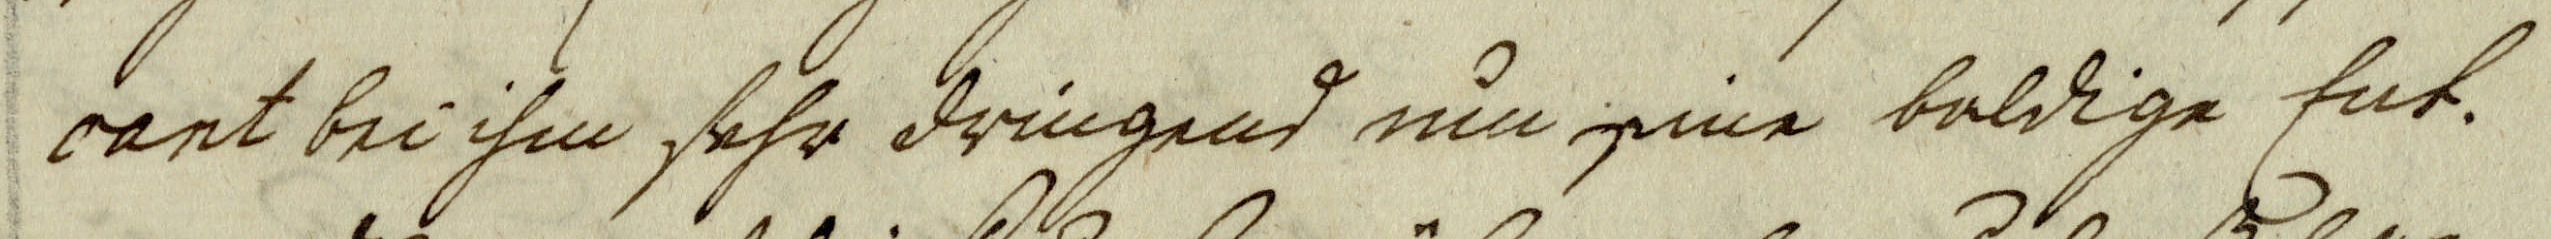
cant bei ihm sehr dringend um eine baldige Ent¬
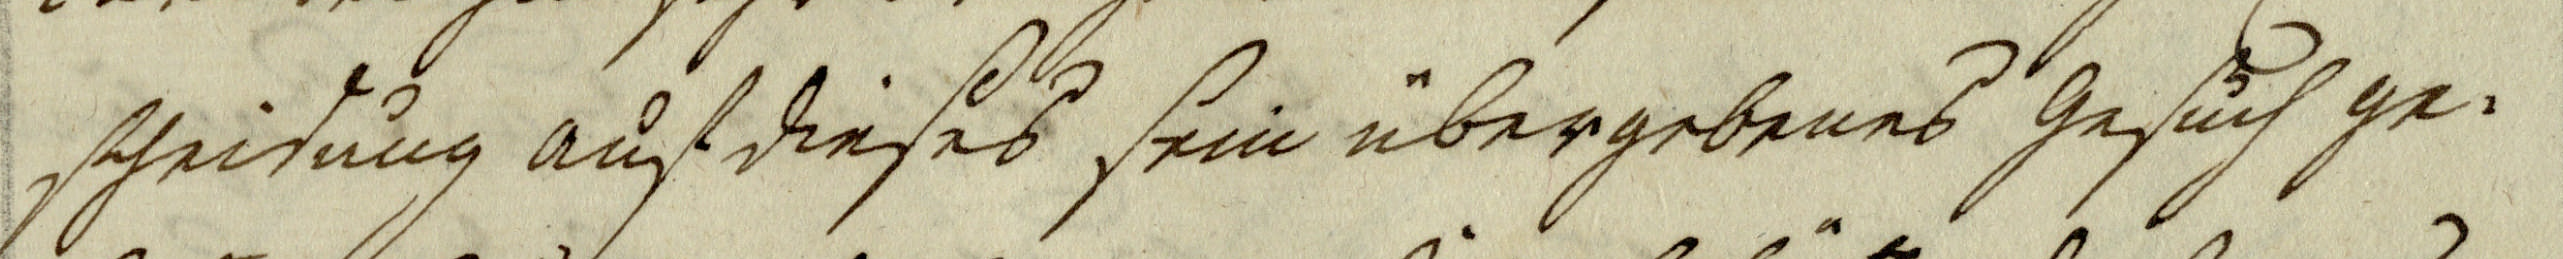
scheidung auf dieses sein übergebenes Gesuch ge¬
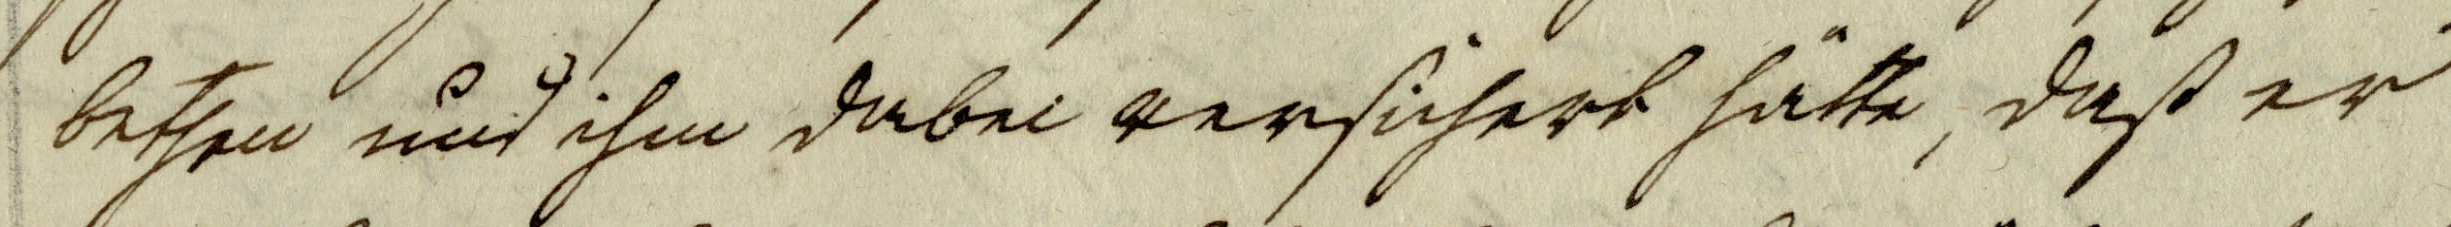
bethen und ihm dabei versichert hätte, daß er
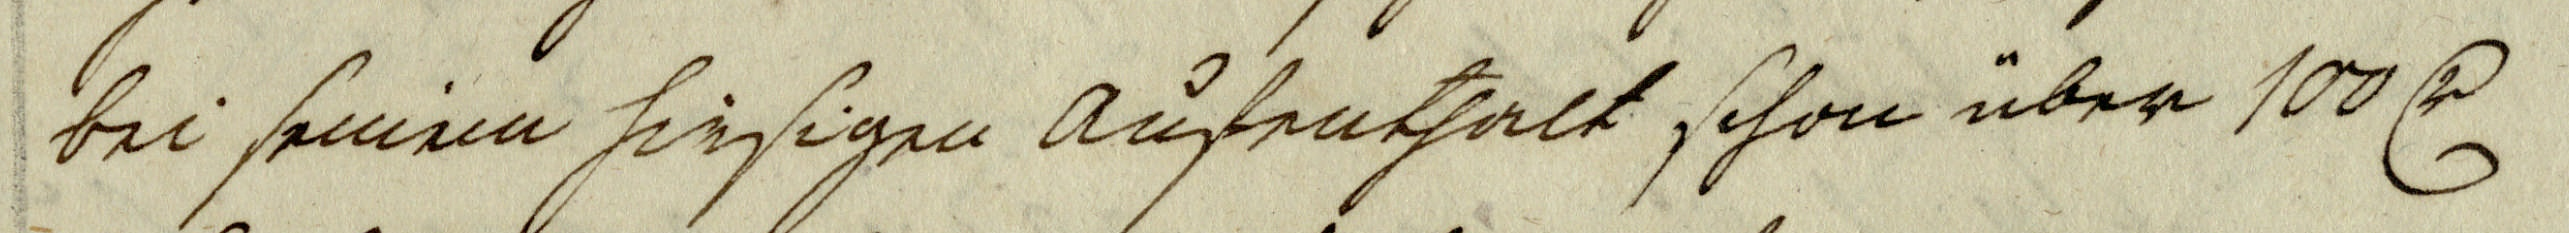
bei seinem hiesigen Aufenthalt schon über 100 rtl.
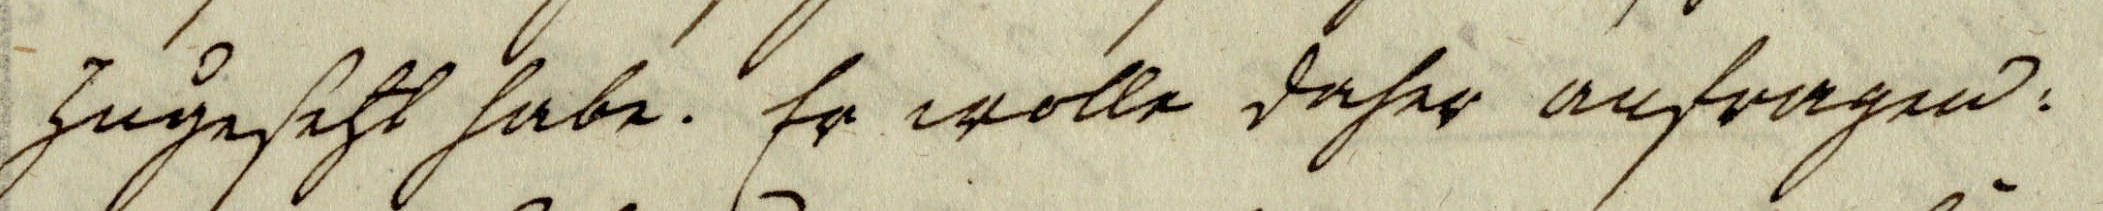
zugesetzt habe. Er wolle daher anfragen:
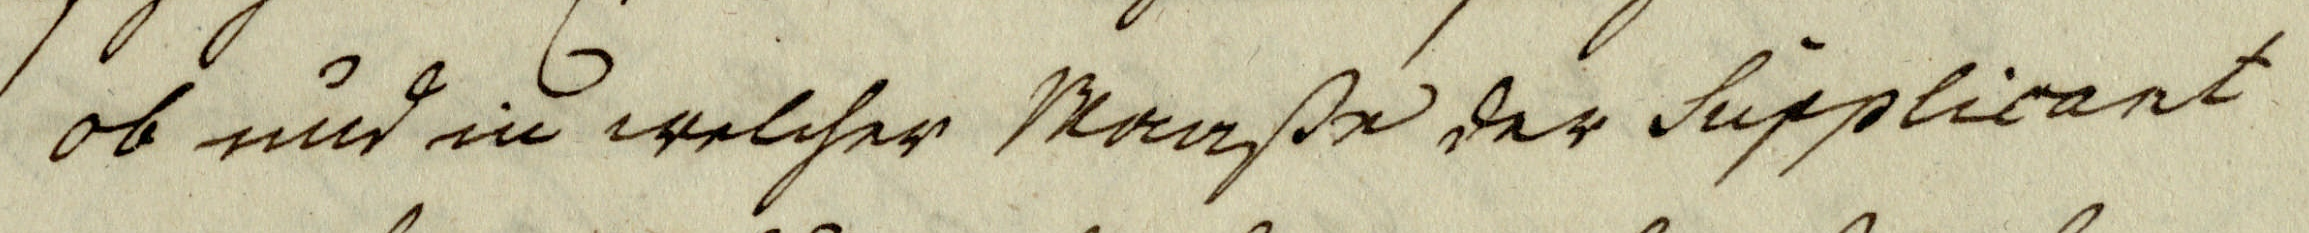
ob und in welcher Maaße der Supplicant
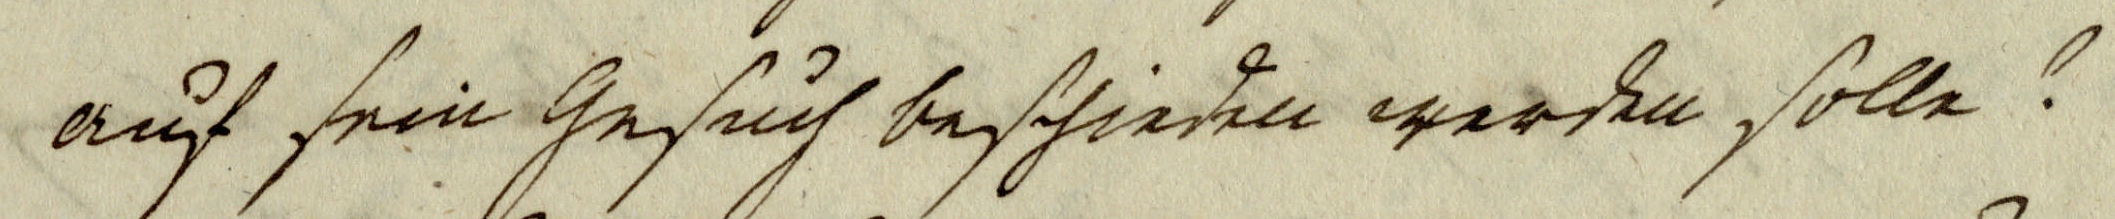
auf sein Gesuch beschieden werden solle?
